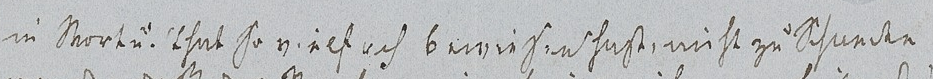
in Wort u. That so vielfach bewiesen hast, nicht zu Schanden
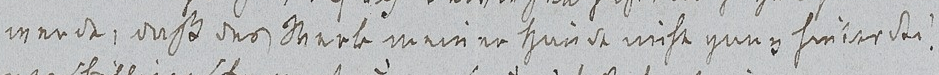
werde, daß das Werk meiner Hände nicht ganz hinter dei-
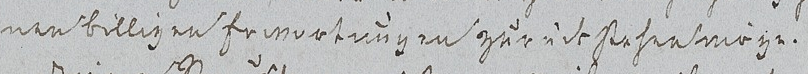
nen billigen Erwartungen zurückstehen möge.
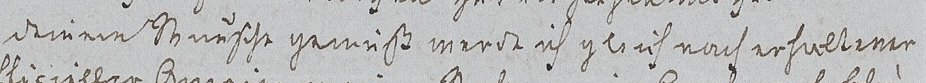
Deinem Wunsche gemäß werde ich gleich nach erhaltener
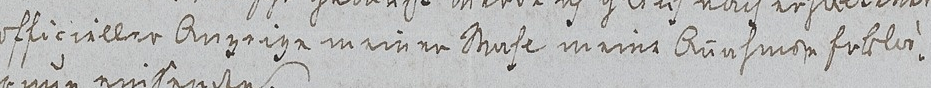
officieller Anzeige meiner Wahl meine Annahms-Erklä-
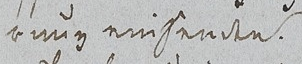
rung einsenden.
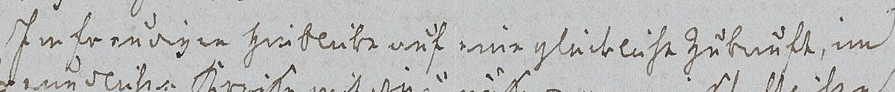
Im freudigen Hinblicke auf eine glückliche Zukunft, im
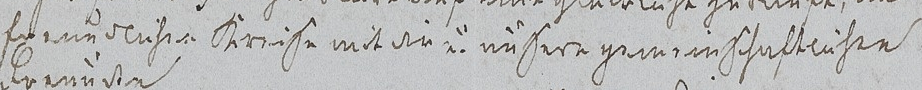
freundlichen Kreise mit dir u. unsern gemeinschaftlichen
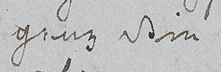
Ganz Dein
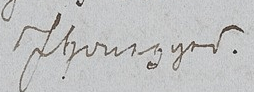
J Honegger.
